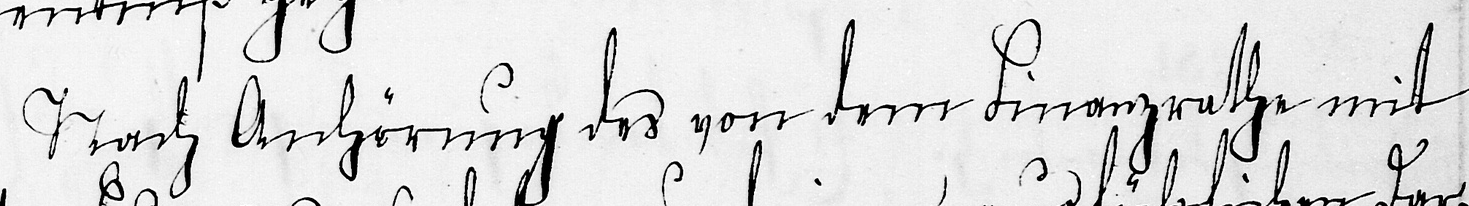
Nach Anhörung des von dem Finanzrathe mit
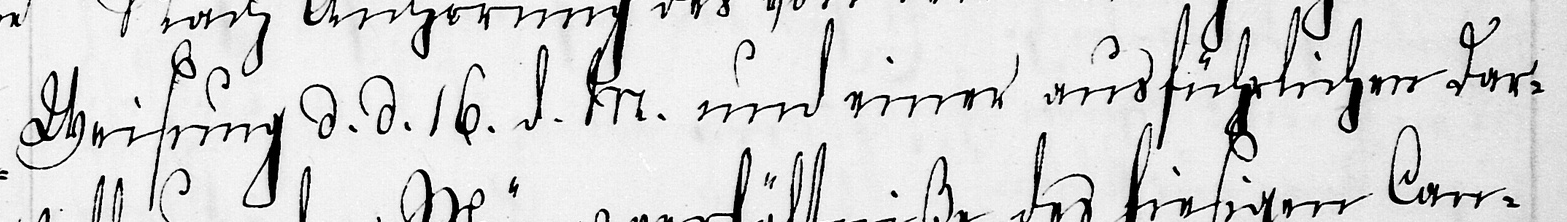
Weisung d. d. 16. d. M. und einer ausführlichen Dars¬
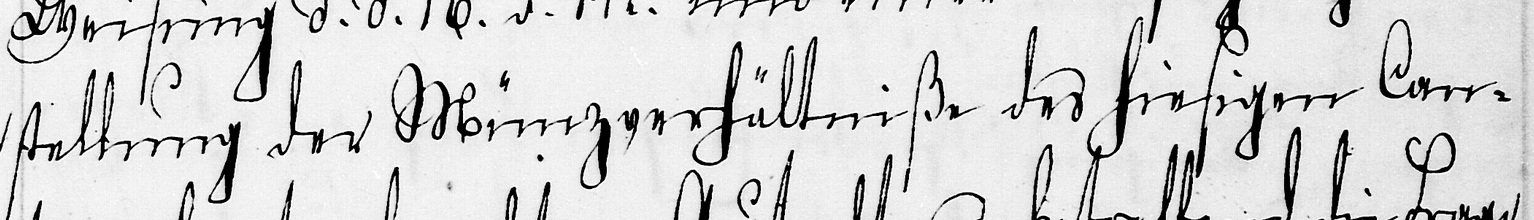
tellung der Münzverhältniße des hiesigen Can¬
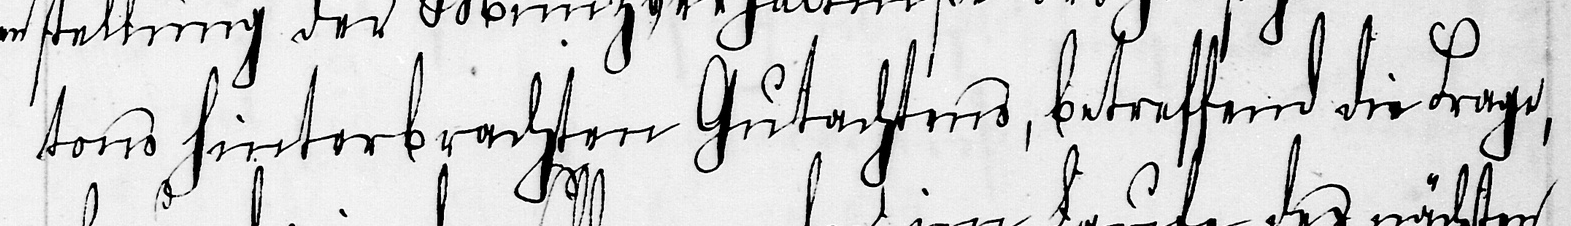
tons hinterbrachten Gutachtens, betreffend die Frag¬
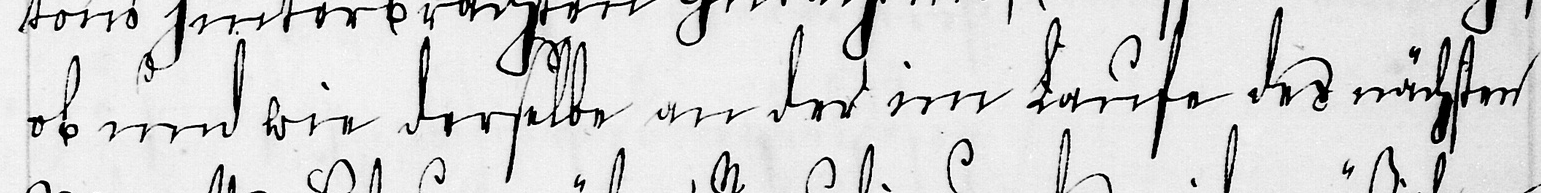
ob und wie derselbe an der im Laufe des nächsten
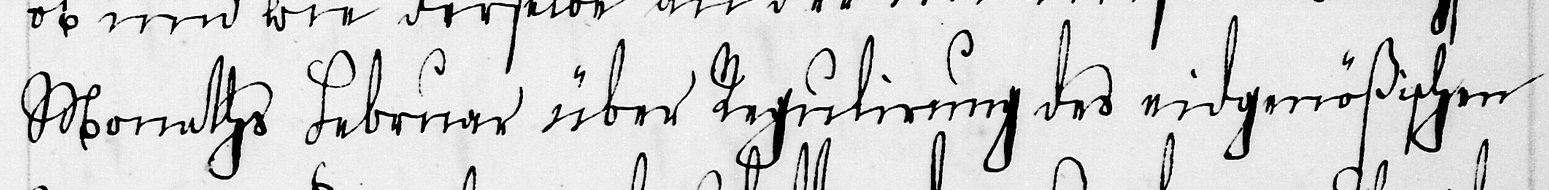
Monaths Februar über Regulirung des eidgenößischen
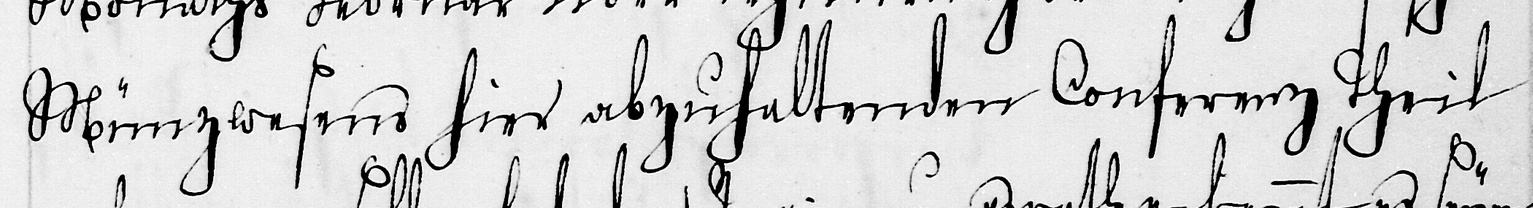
Münzwesens hier abzuhaltenden Conferenz Theil
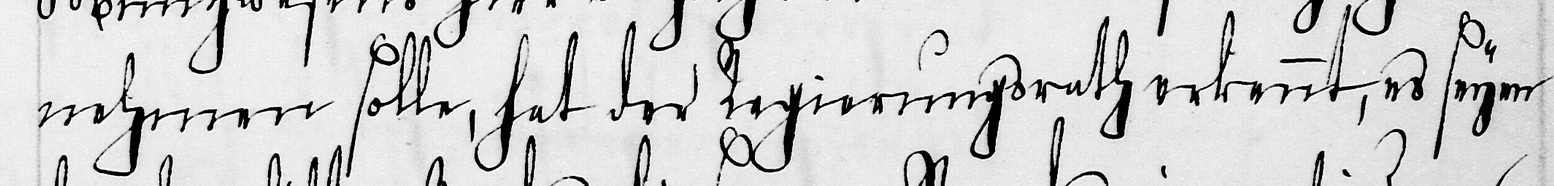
nehmen solle, hat der Regierungsrath erkannt, es seyen
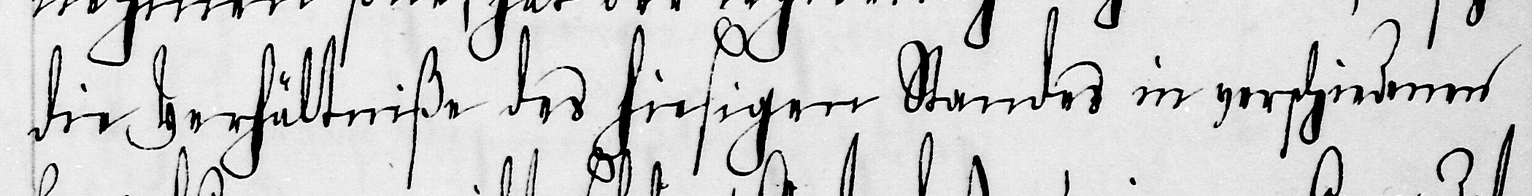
die Verhältniße des hiesigen Standes in verschiedenen
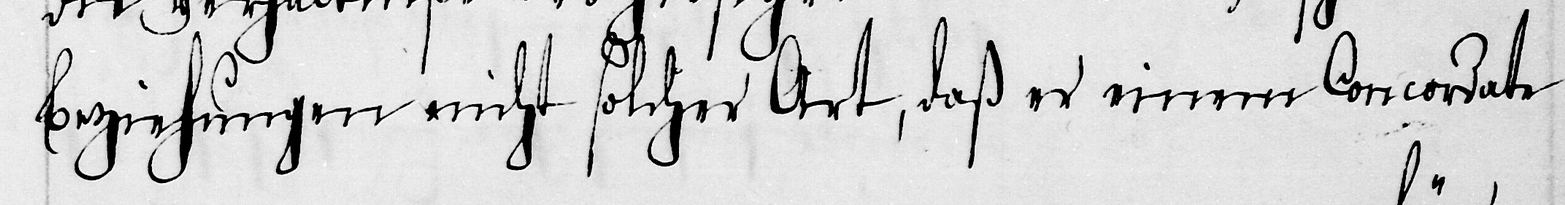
Beziehungen nicht solcher Art, daß er einem Concordate
